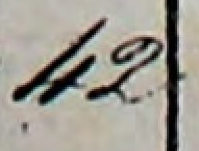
42
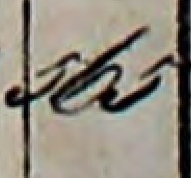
565
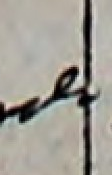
do
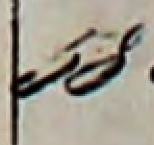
58
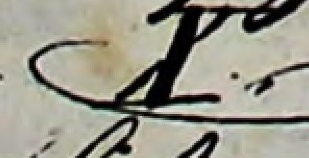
X.
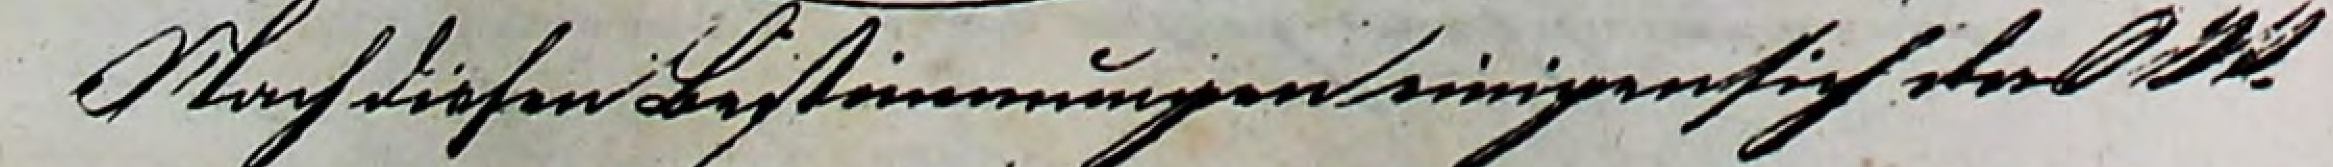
Nach diesen Bestimmungen einigen sich das kk.
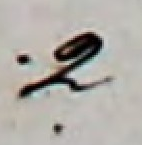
2
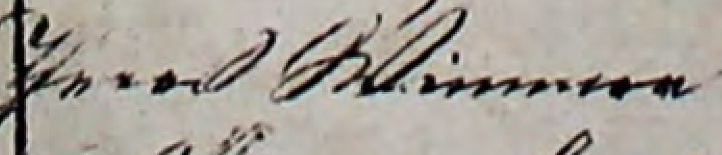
Theres Wimmer
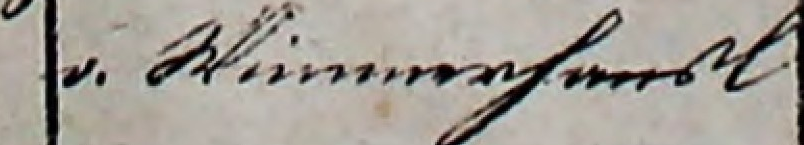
v. Wimmerhansl
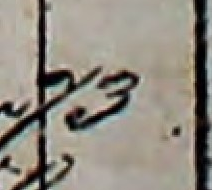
73
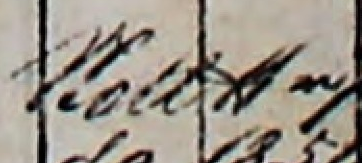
Nott Hnr
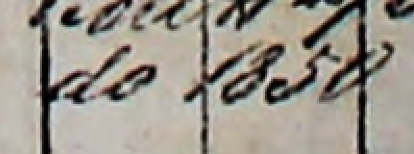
do 1850
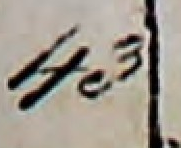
43
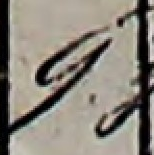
9
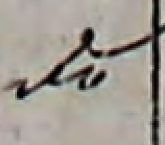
do
